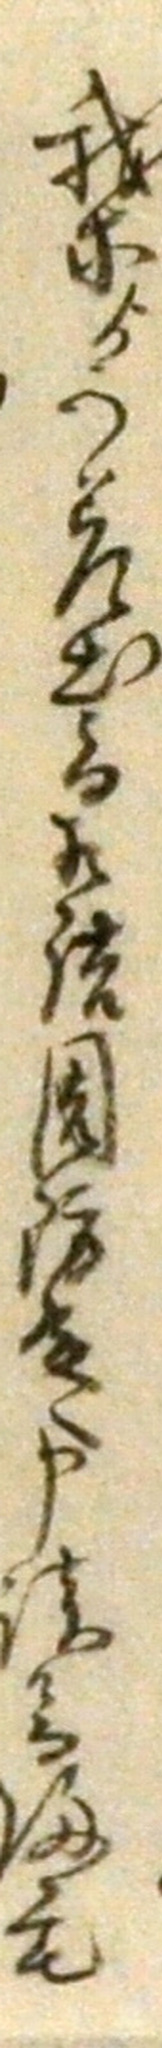我等ゟ可差出旨相詰周防殿へ申談候而帰宅
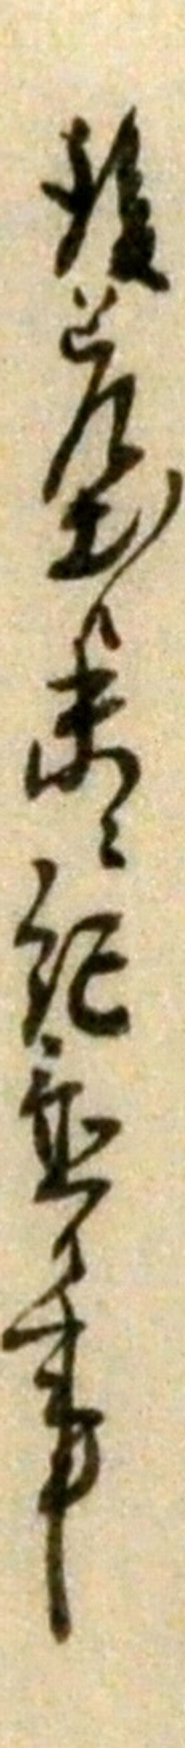後差出候末ニ記置候事
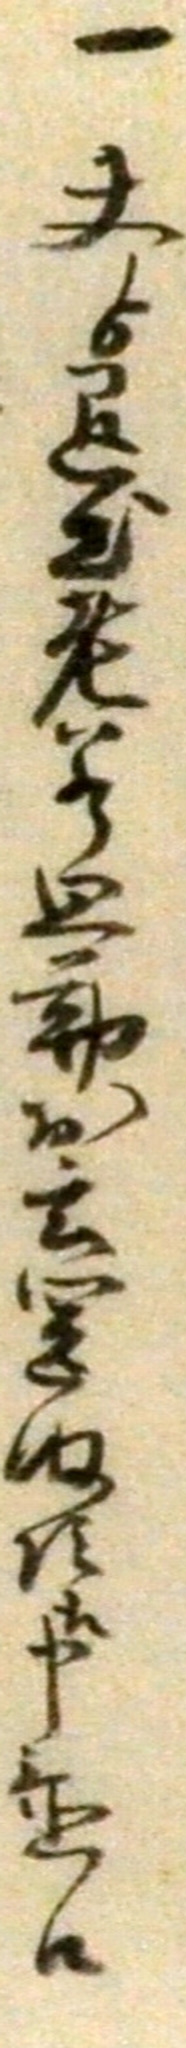一夫ゟ退出老若廻勤於玄関取次え申置候
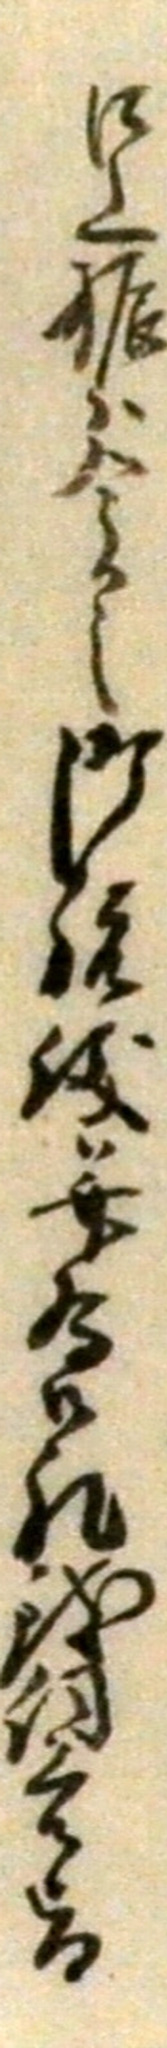口上振ハ今日之御祝儀并為御礼致伺公候旨
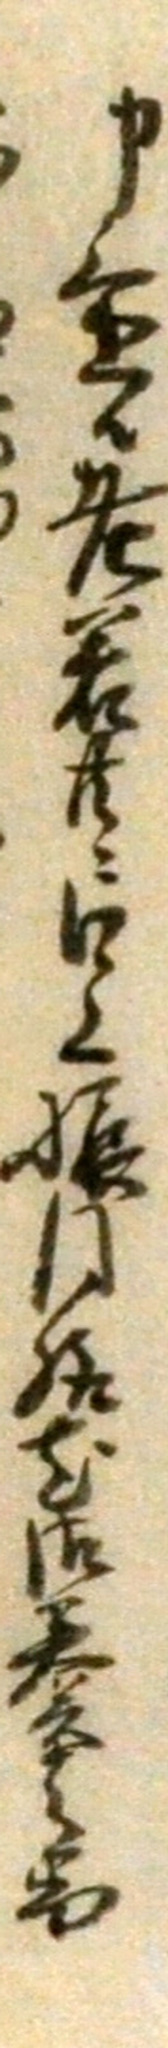申置候老若共ニ口上振同様尤御奏者番
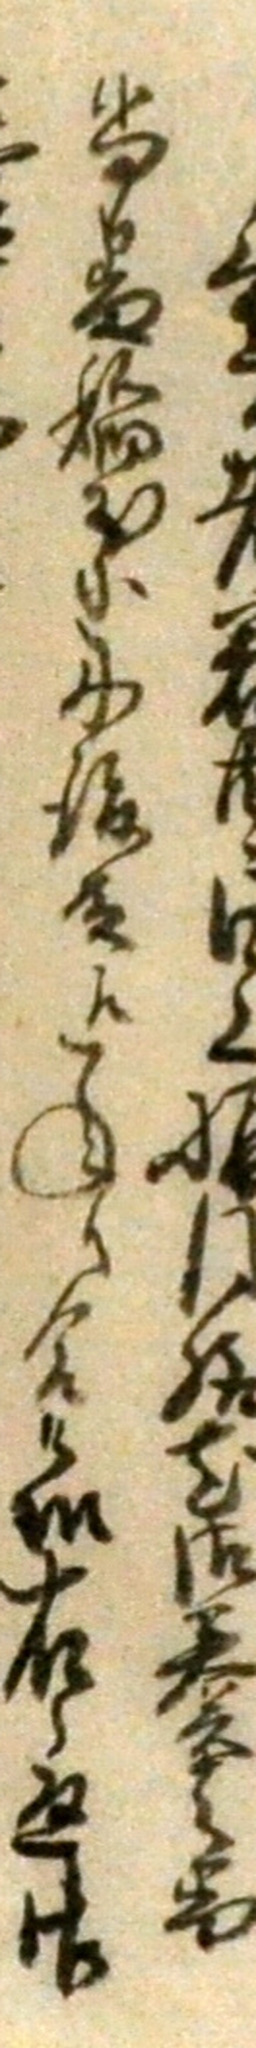当番稲葉丹後殿え承り合候処右之通御
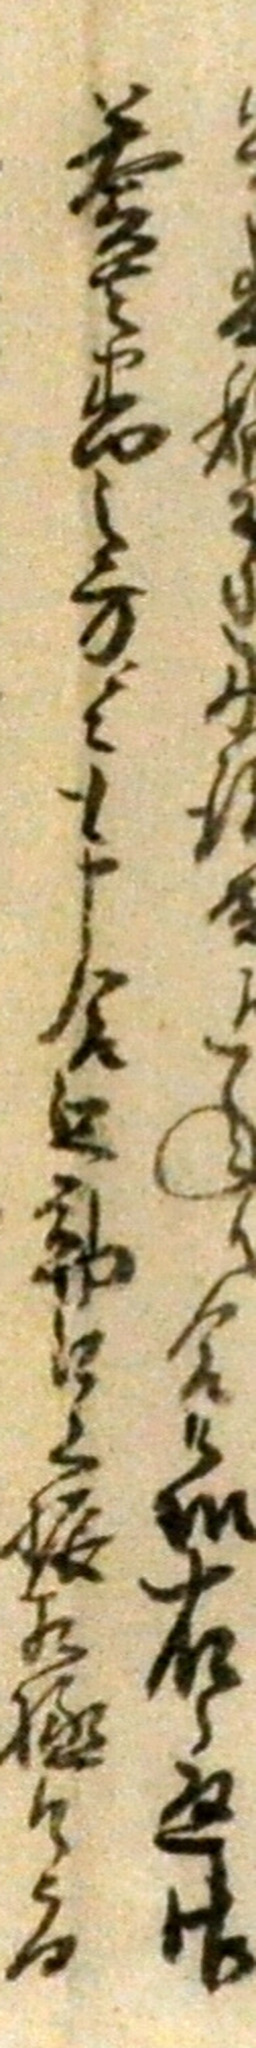奏者番之方ニても申合廻勤口上振相極候旨
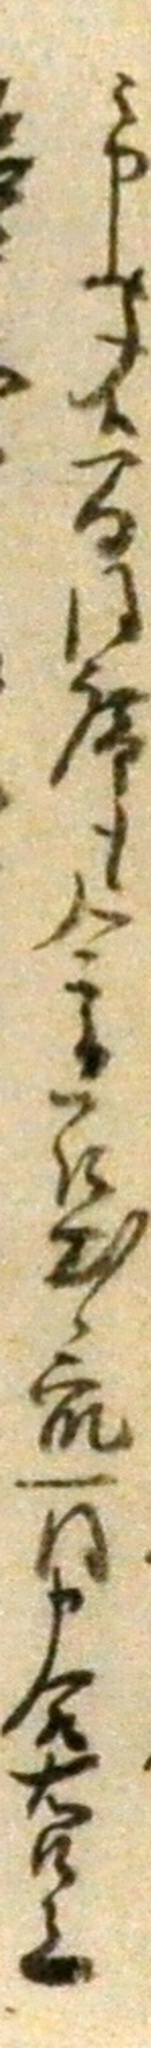被申聞候間同席も今日罷出候衆一同申合右口上
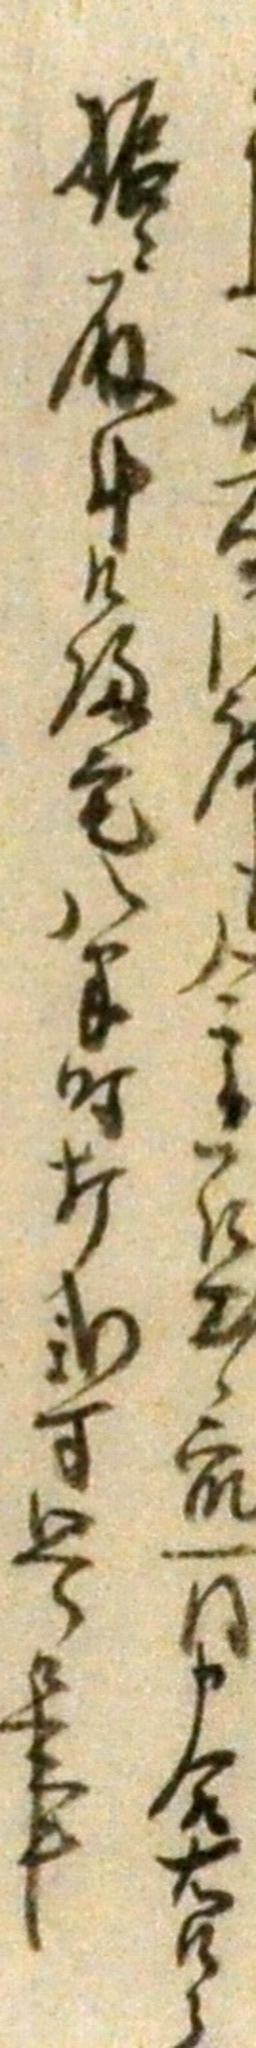振ニ取計候帰宅八半時打弐寸廻り候事
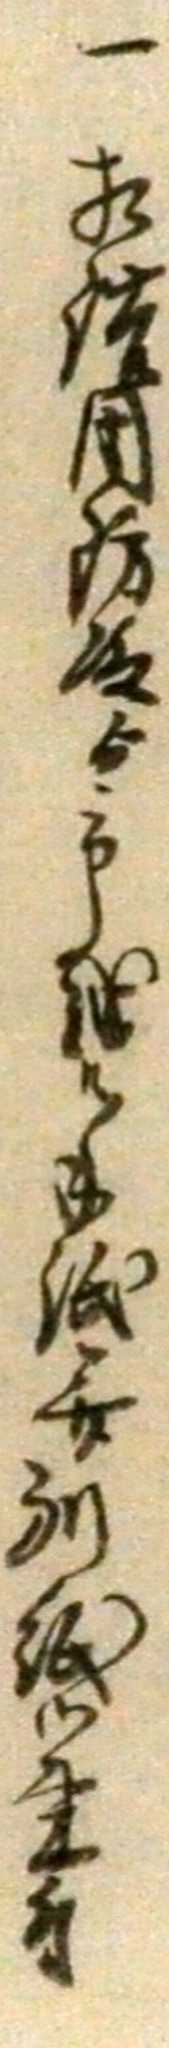一相詰周防殿ゟ被申越候手紙并別紙御書付
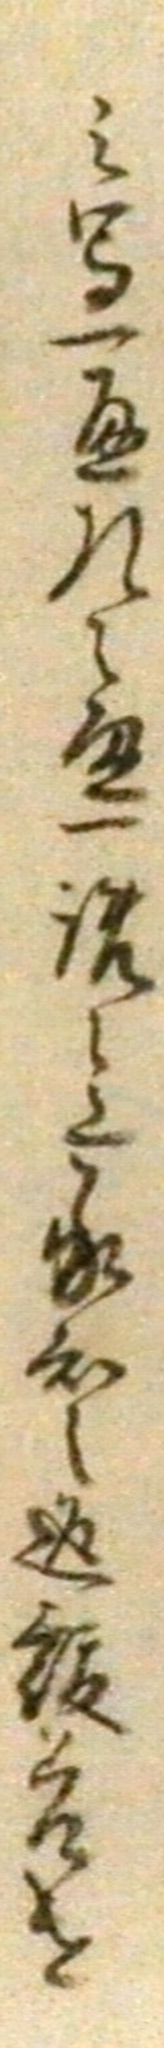之写一通左之通一覧之上承知之返報差遣
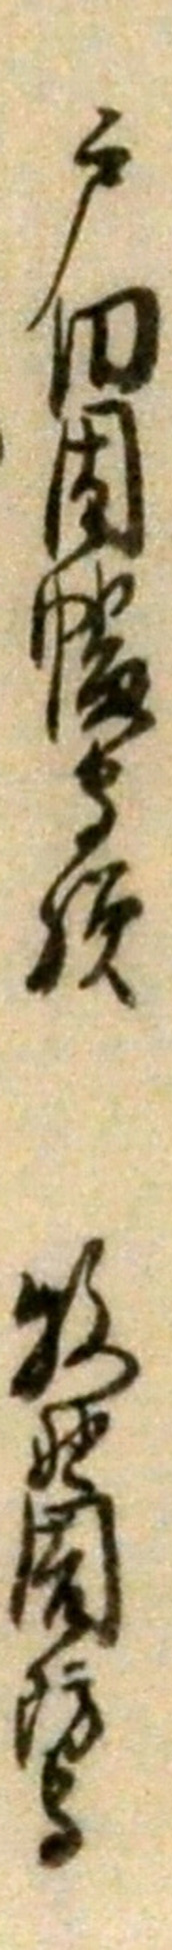戸田因幡守様牧野周防守
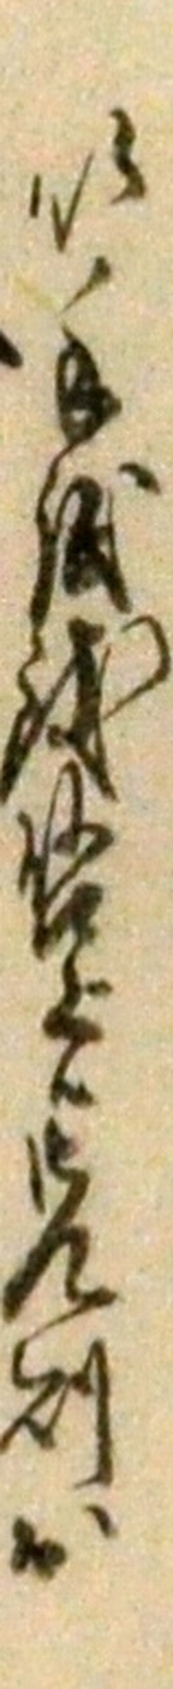以手紙致啓上候先刻於
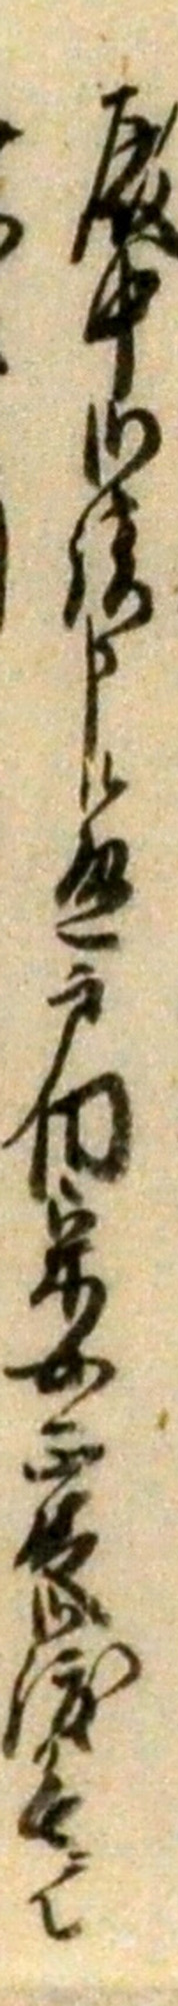殿中御談申候通戸田采女正殿御渡候由ニて
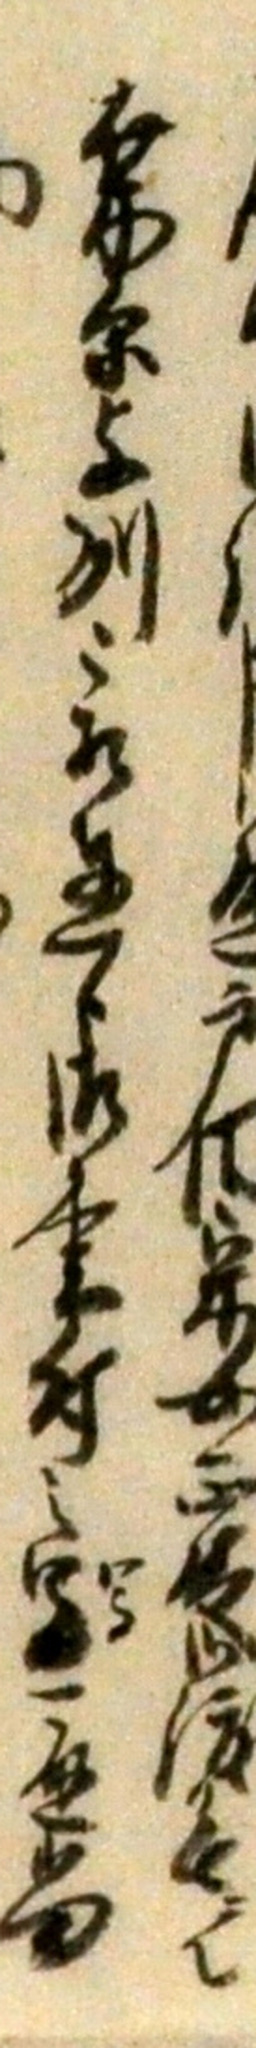桑原豫州被相達候御書付之写一通当
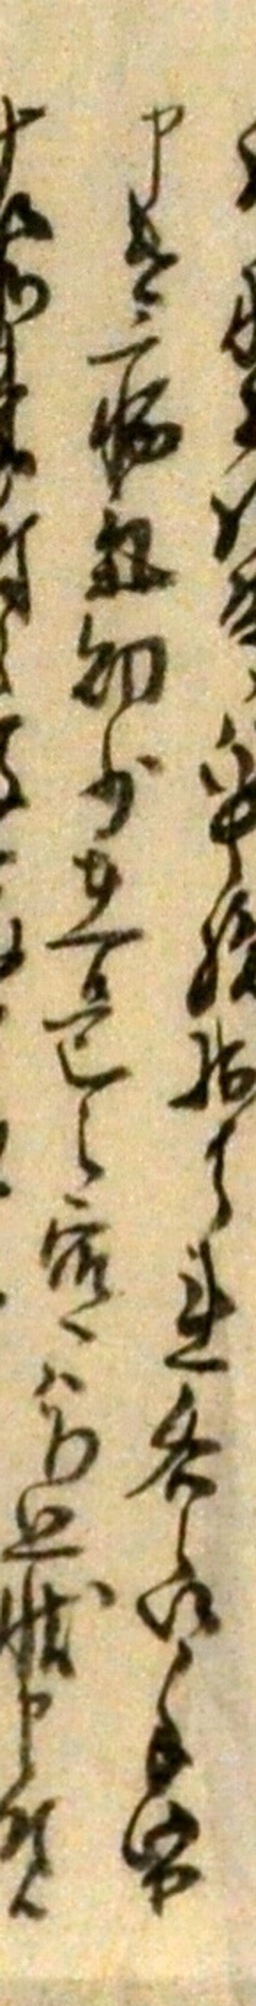申遣病気幼少在邑之衆ヘハ下廻状申付候
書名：若君様御色直御祝儀ノ節ノ留
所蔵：伊那市立高遠町図書館・合同会社AMANE
